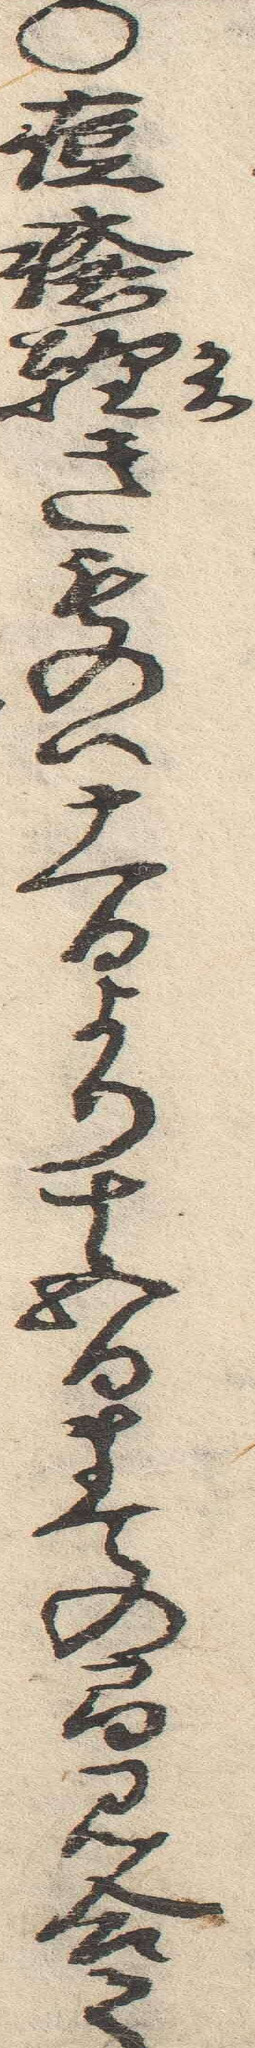○痘瘡軽きものは十一日より十五日まての間見合て
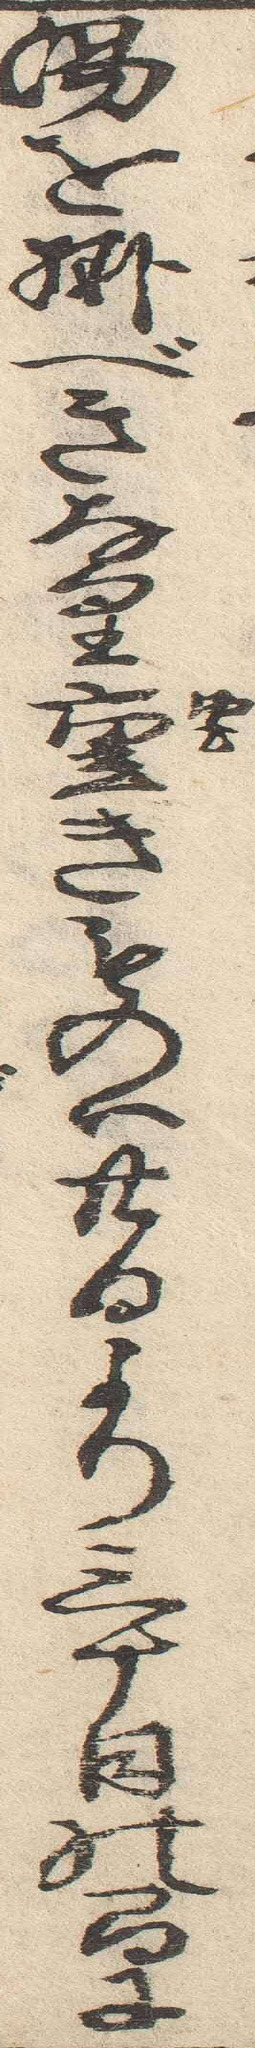湯を掛べきなり重きものは廿日より三十日の間に
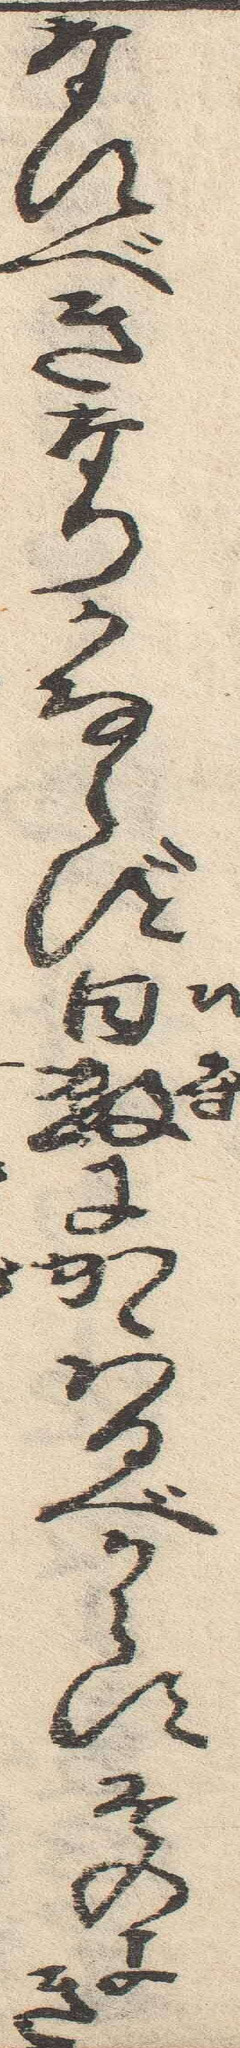なすべきなりかならず日数にかゝわるべからすそのよき
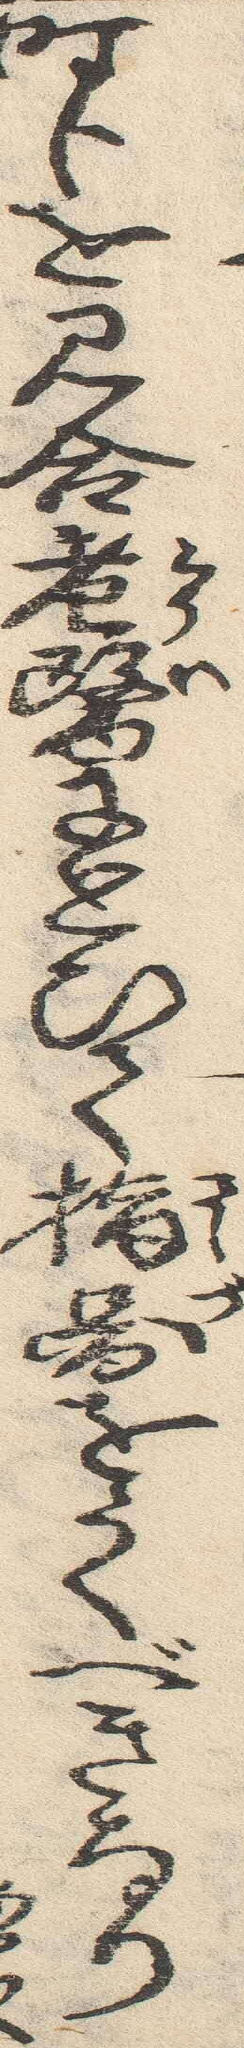時分を見合老医にとひて指図をうくべきなり
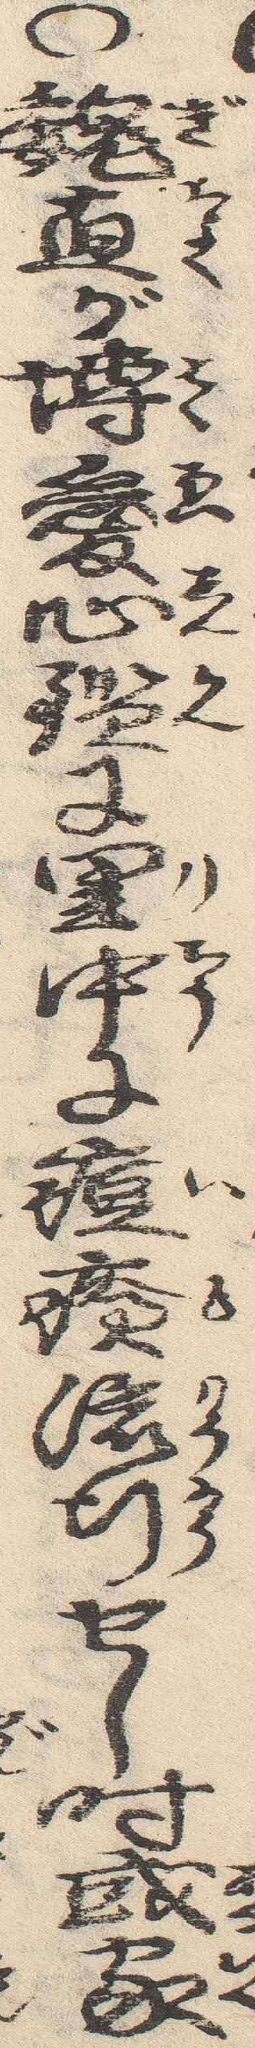○魏直が博愛心鑑に里中に痘瘡流行せし時或家
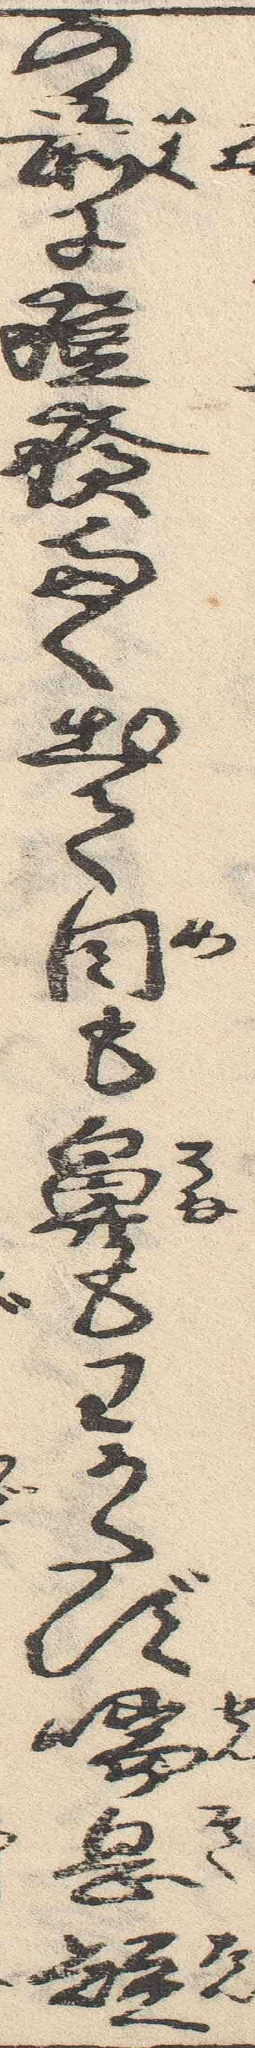の前に痘瘡多く出て目も鼻もわからず喘息短
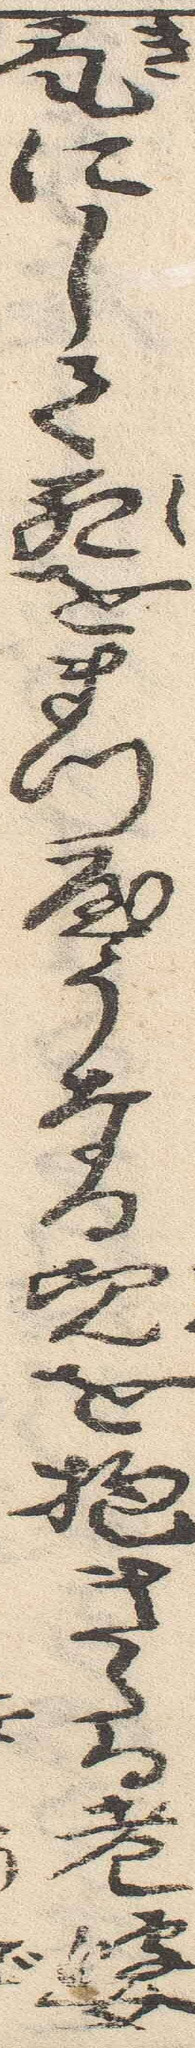気にして死をまつやうなる児を抱きたる老婆
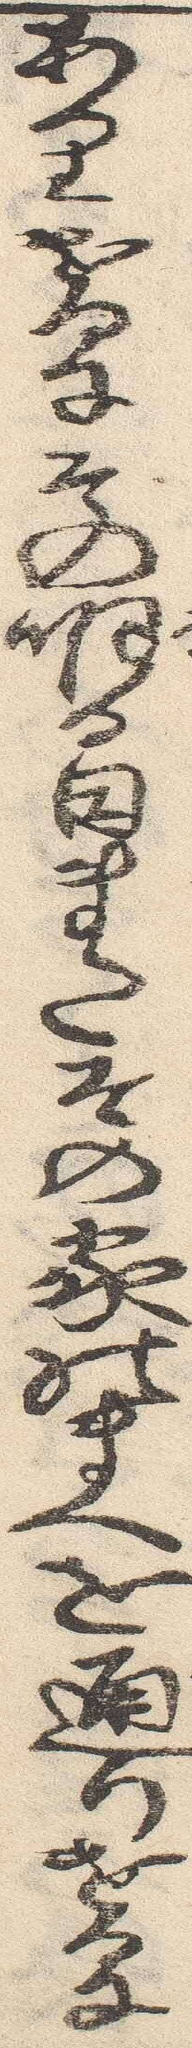ありけるにその明る日またその家のまへを通りけるに
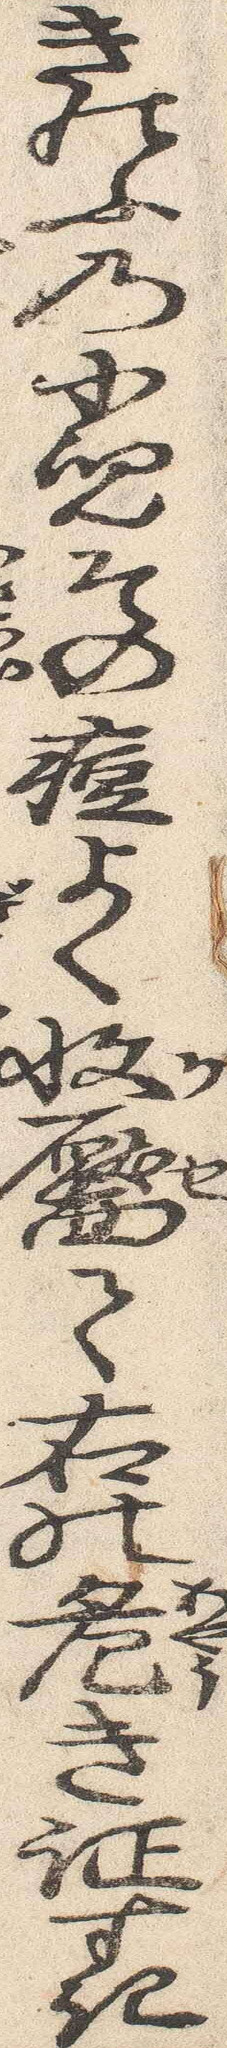きのふの小児その痘よく収靨て右の危き証すき
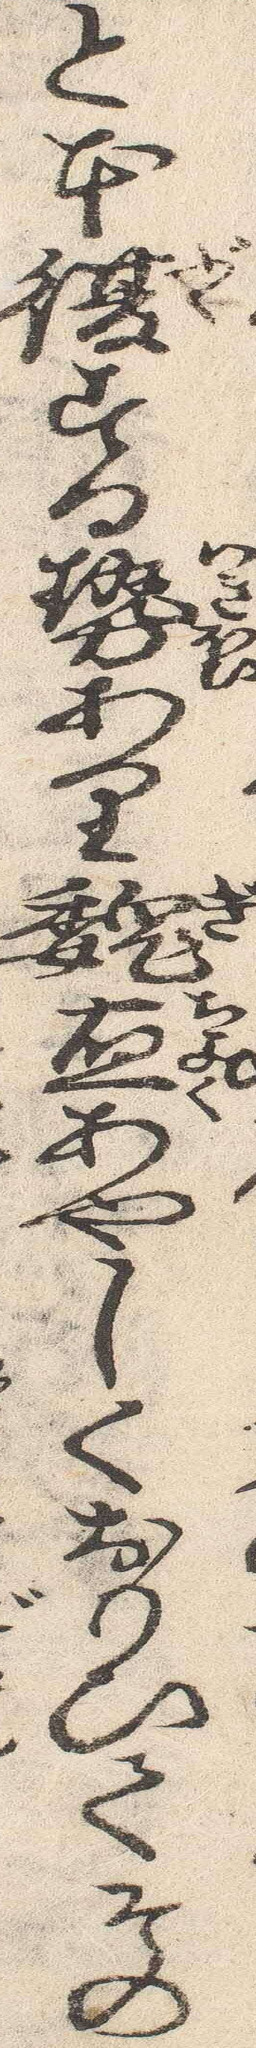と本復する勢あり魏直あやしくおもひてその
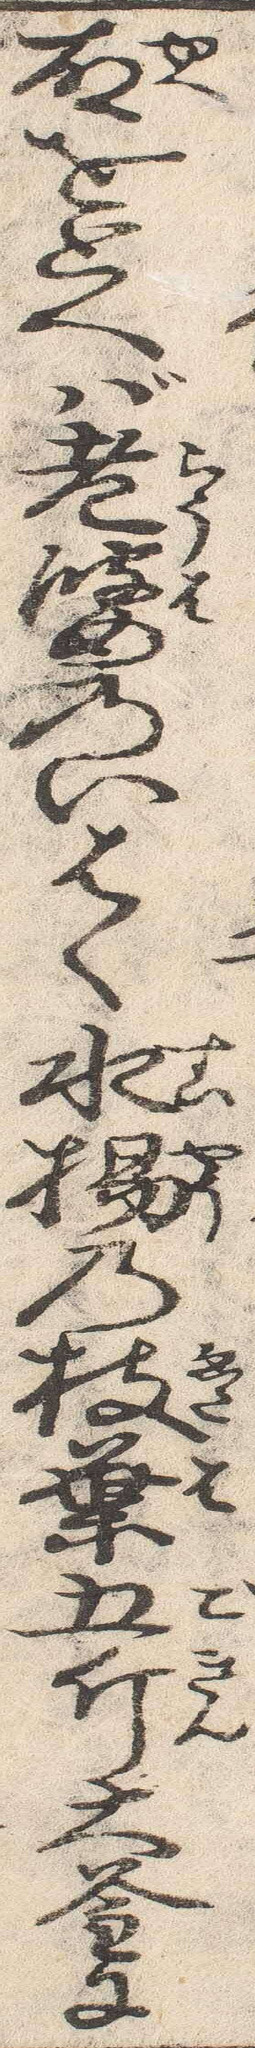故をとへば老婆のいはく水楊の枝葉五斤大釜に
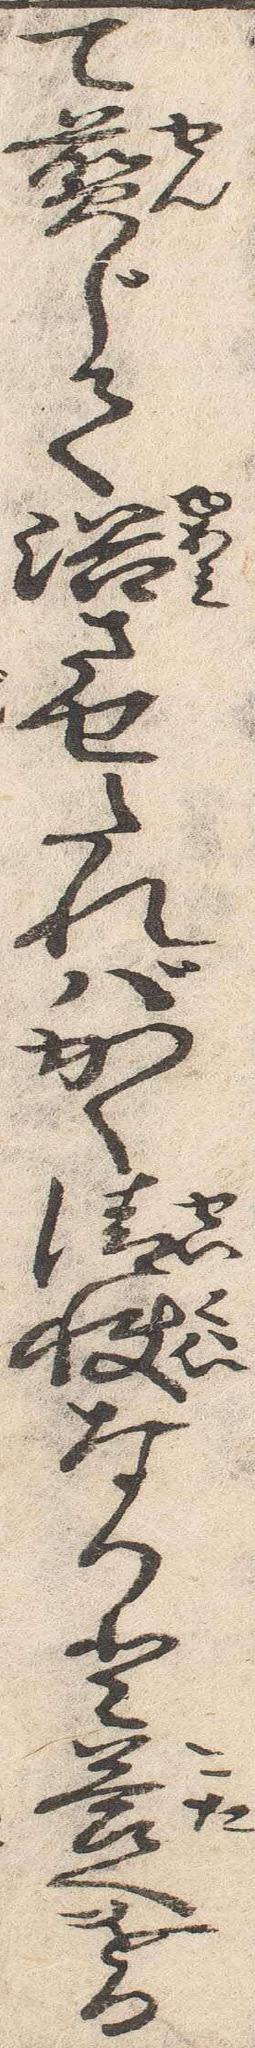て煎じて浴させたればかく清快なりと答へける
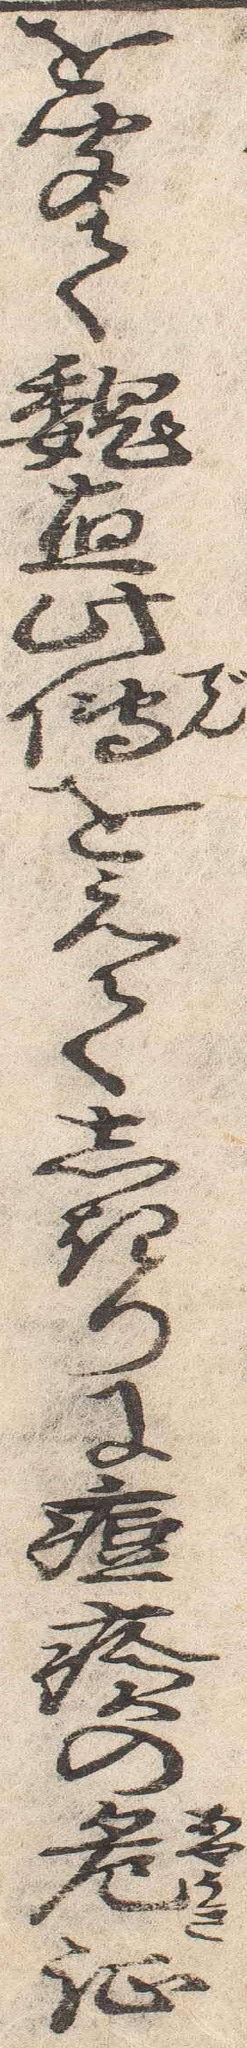を聞て魏直此伝をえてしきりに痘瘡の危証
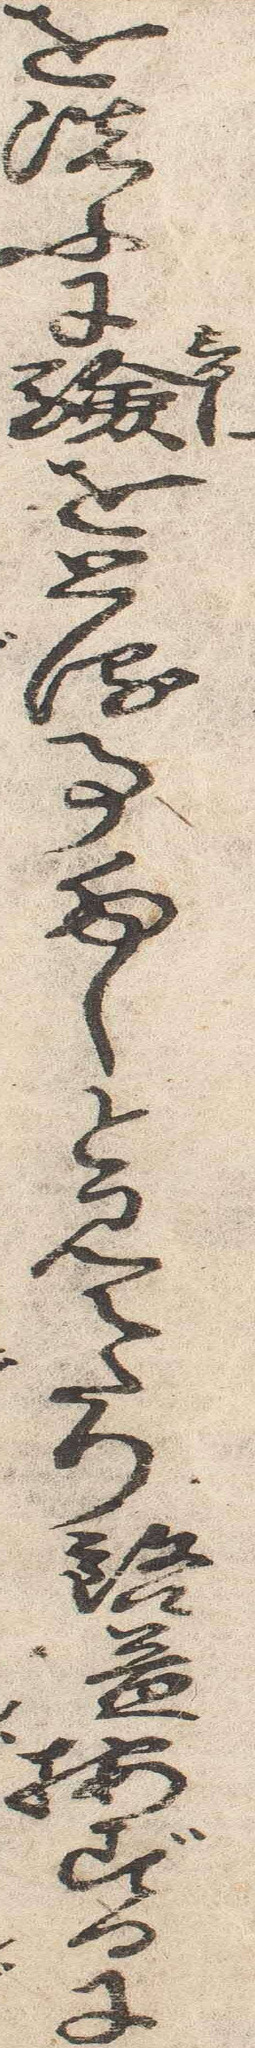を洗ふに験をとる事多しと見えたり啓益按ずるに
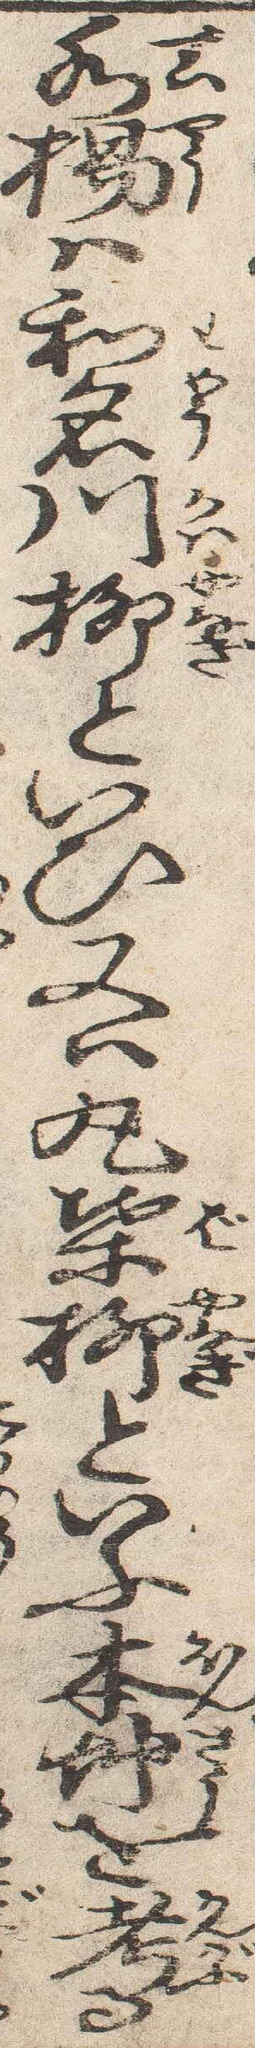水楊は和名川柳といひ又は丸葉柳といふ本草を考る
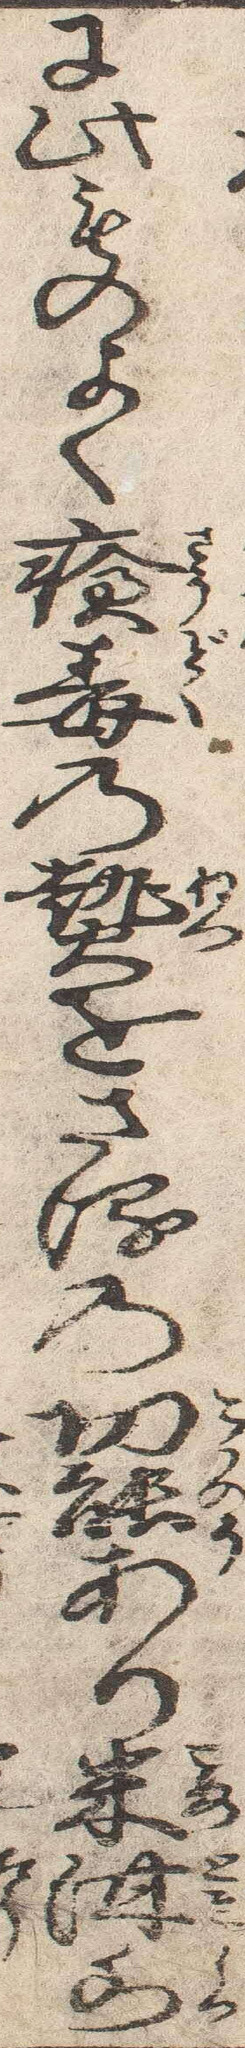に此ものよく瘡毒の熱をさるの功能あり米泔水
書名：小児必用養育草
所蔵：東京学芸大学附属図書館 国文学研究資料館
